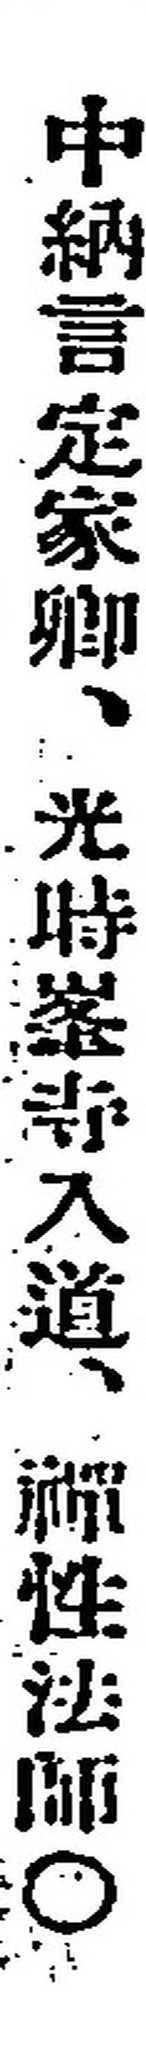中納言定家卿、光時峯寺入道、禅性法師○
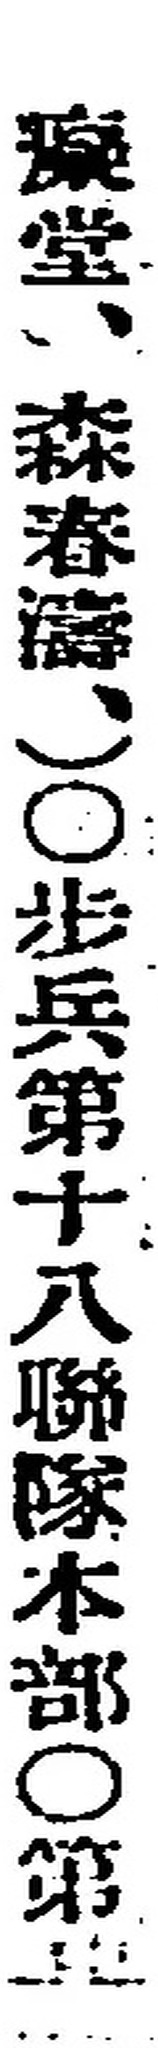痴堂、森春濤、)○歩兵第十八聯隊本部○第
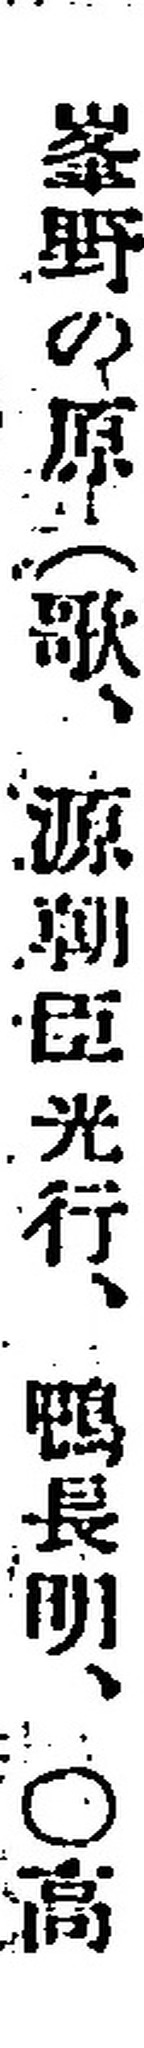峯野の原(歌、源朝臣光行、鴨長明、○高
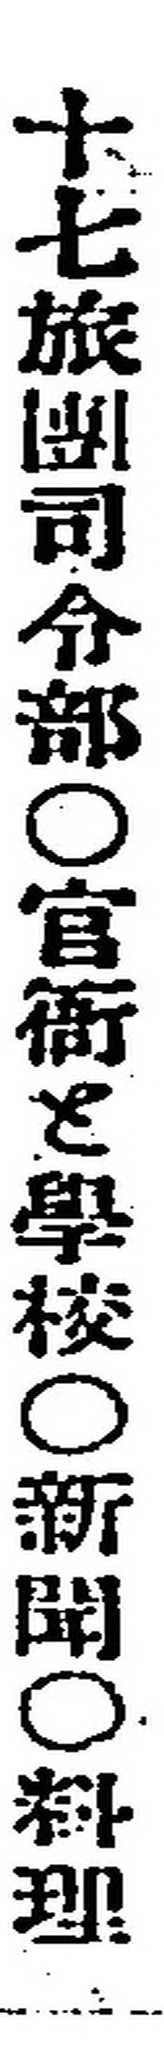十七旅団司令部○官衙と学校○新聞○料理
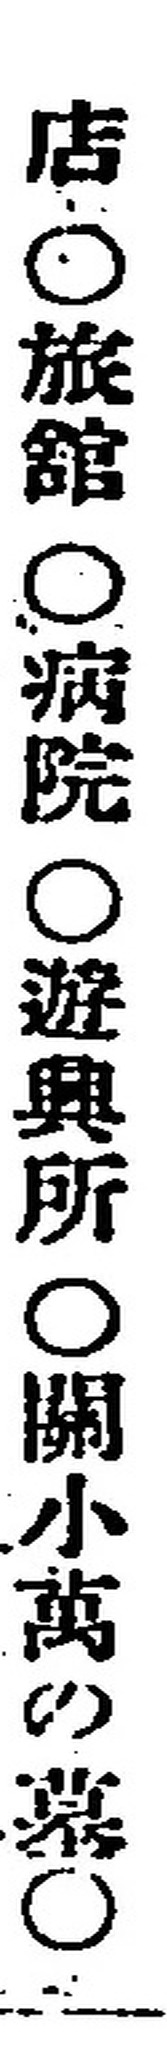店○旅舘○病院○遊興所○関小万の墓○

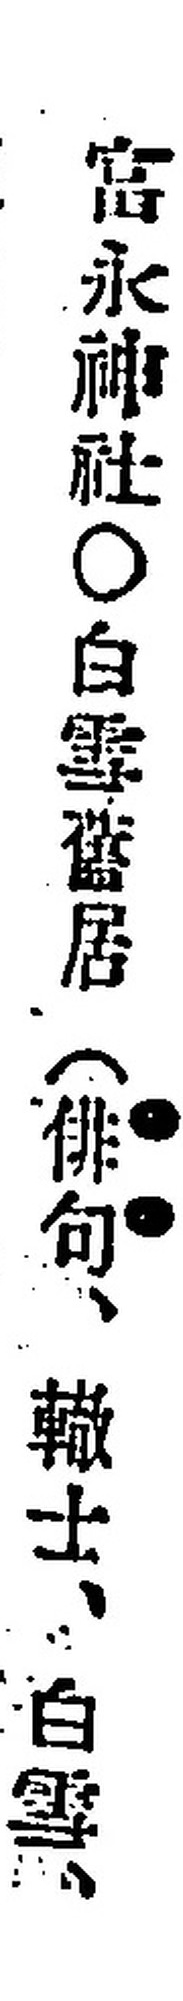○富永神社○白雪旧居(俳句、轍士、白雪、
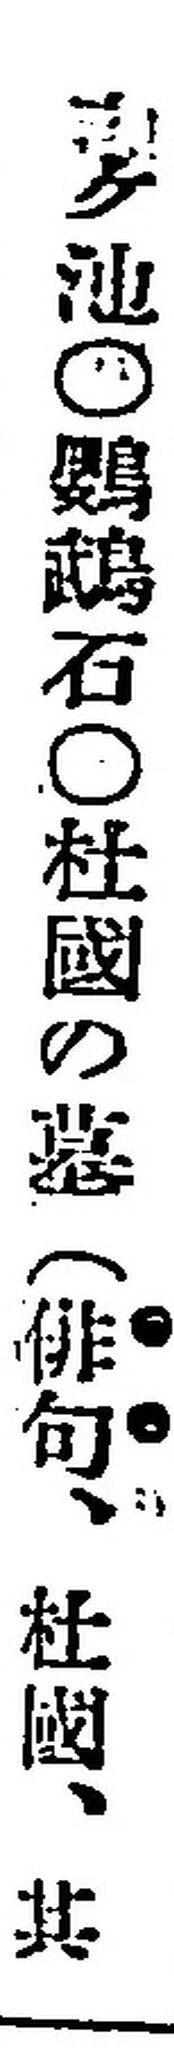ヶ池○鸚鵡石○杜国の墓(俳句、杜国、其
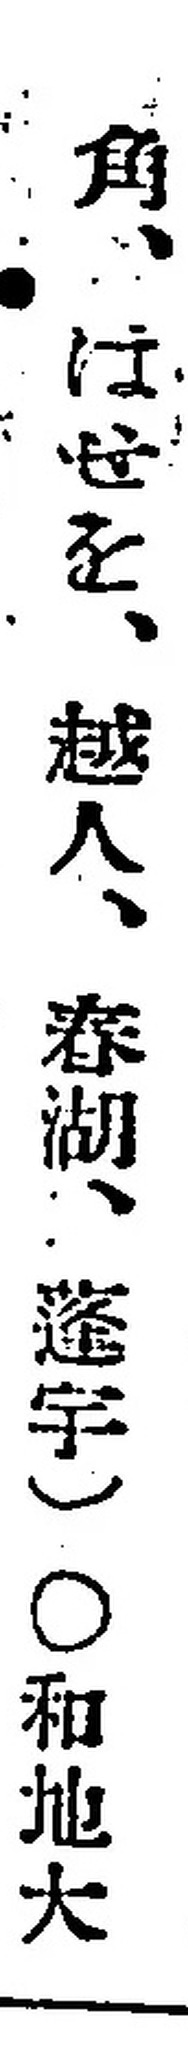角、はせを、越人、春湖、蓬宇)○和地大
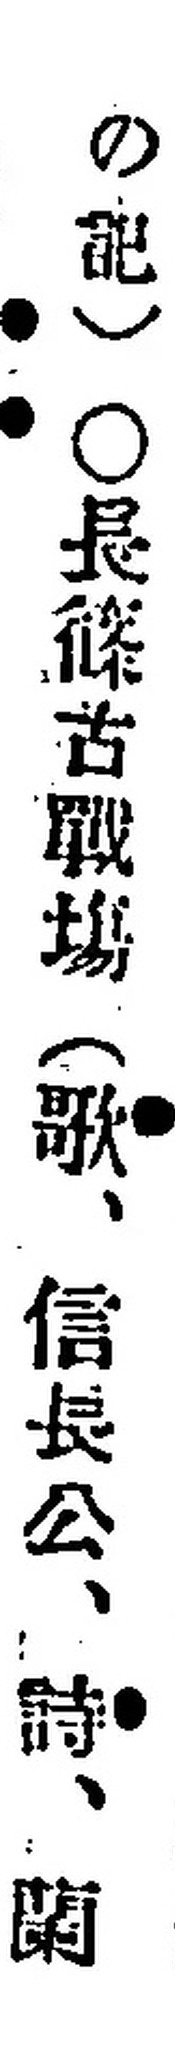の記)○長篠古戦場(歌、信長公、詩、蘭
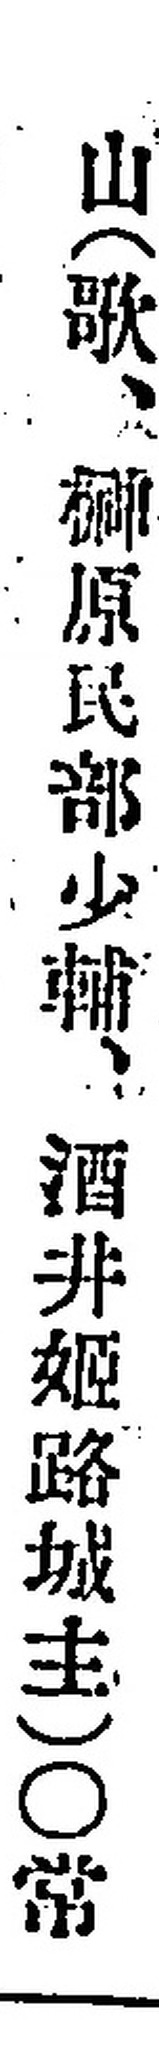山(歌、榊原民部少輔、酒井姫路城主)○常
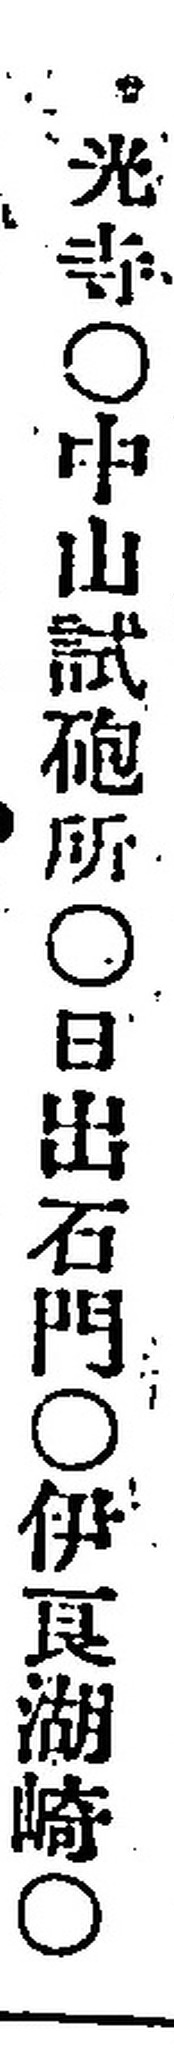光寺○中山試砲所○日出石門○伊良湖崎○
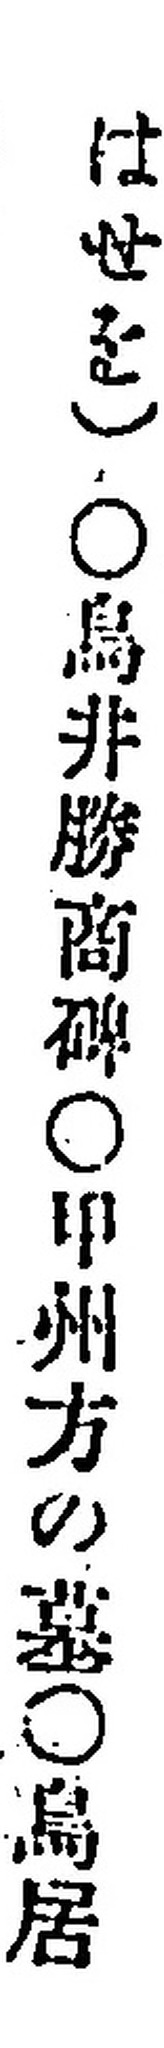はせを)○鳥井勝商碑○甲州方の墓○鳥居
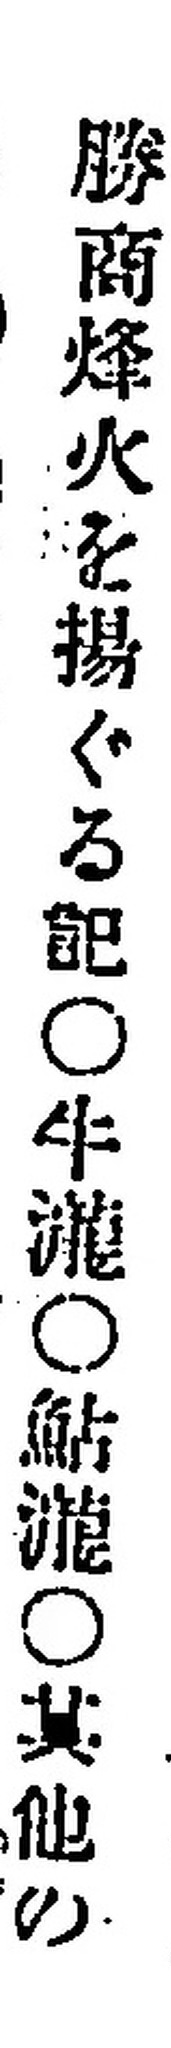勝商烽火を揚ぐる記○牛瀧○鮎瀧○其他の
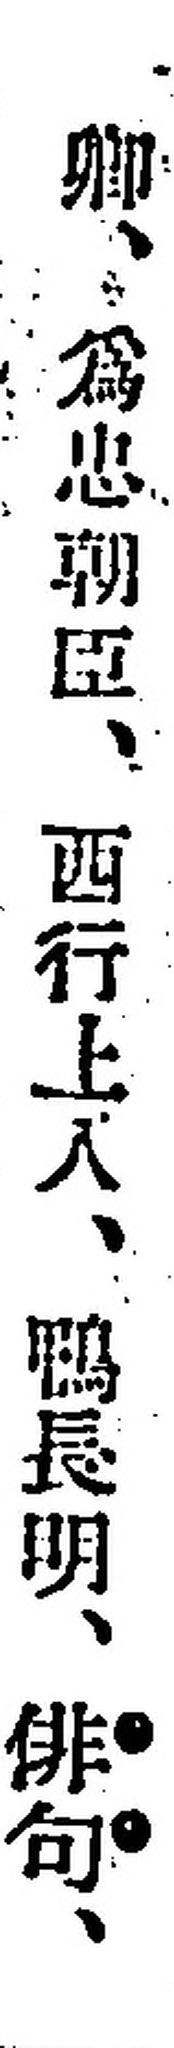卿、為忠朝臣、西行上人、鴨長明、俳句、
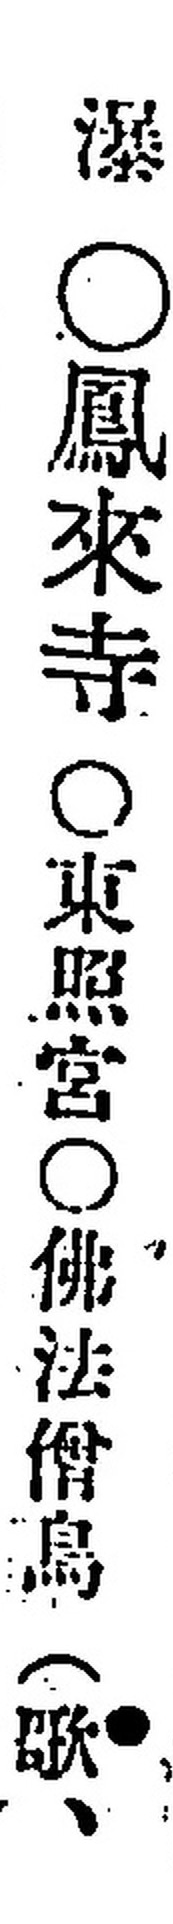瀑○鳳来寺○東照宮○仏法僧鳥(歌、
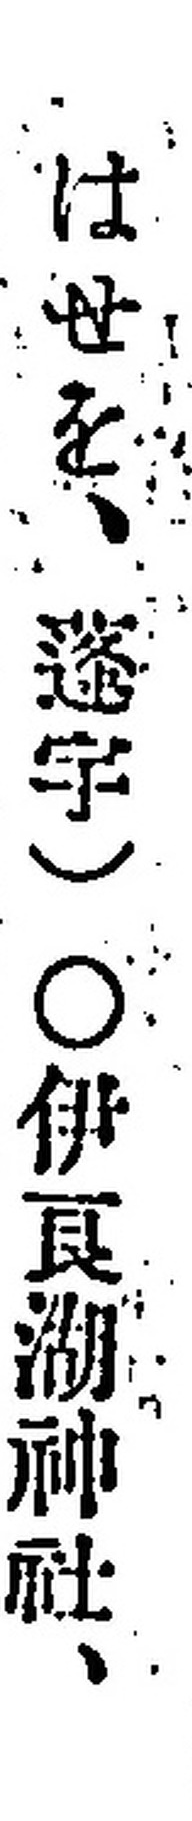はせを、蓬宇)○伊良湖神社、
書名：東参名勝案内
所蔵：国立国会図書館 National Diet Library, JAPAN
